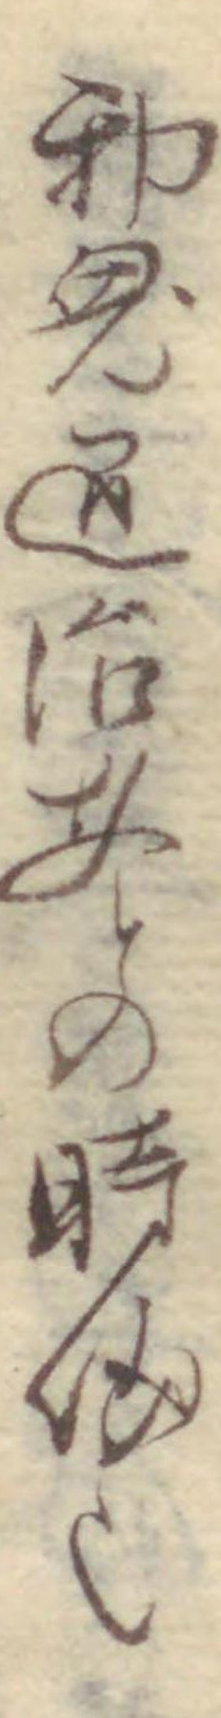邪気退治なとの時儀也
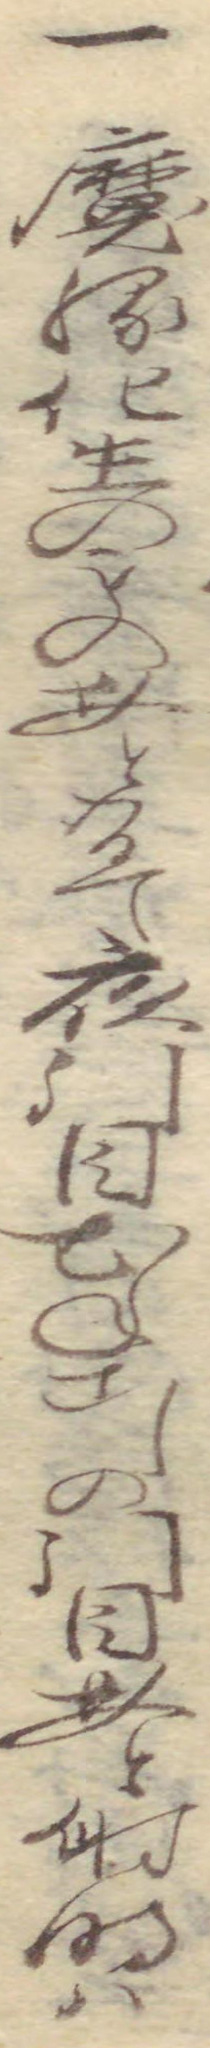一魔縁化生のものなと有て夜引目むねこしの引目なと射時ハ
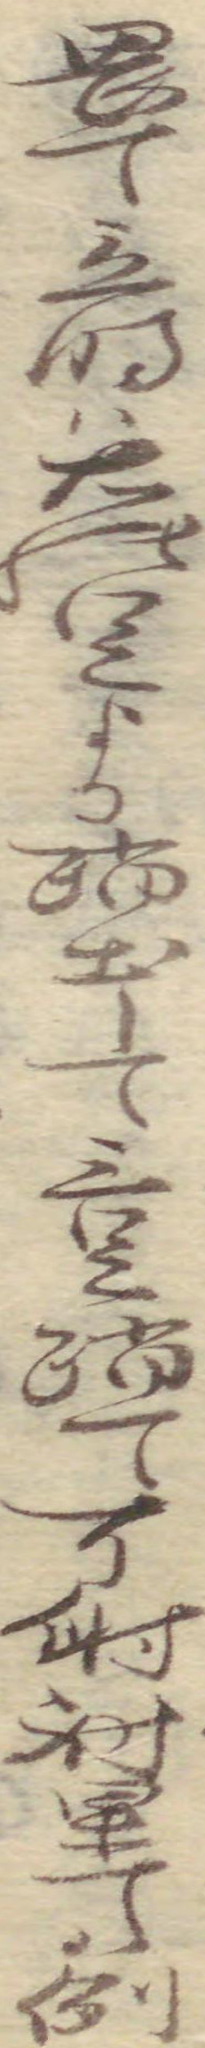畏て立時ハ右の足より踏出て三足踏て可射射果てハ例
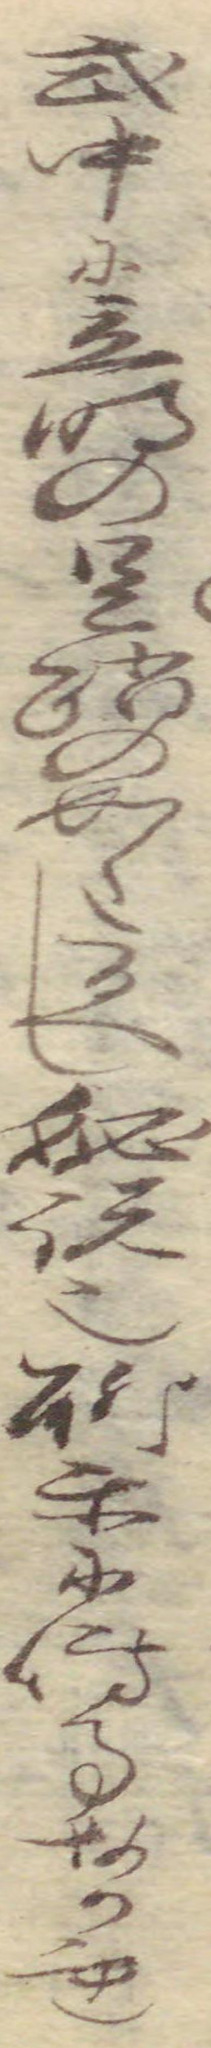式中に立時の足踏の如たるへし秘説也聊爾に伝事なかれ
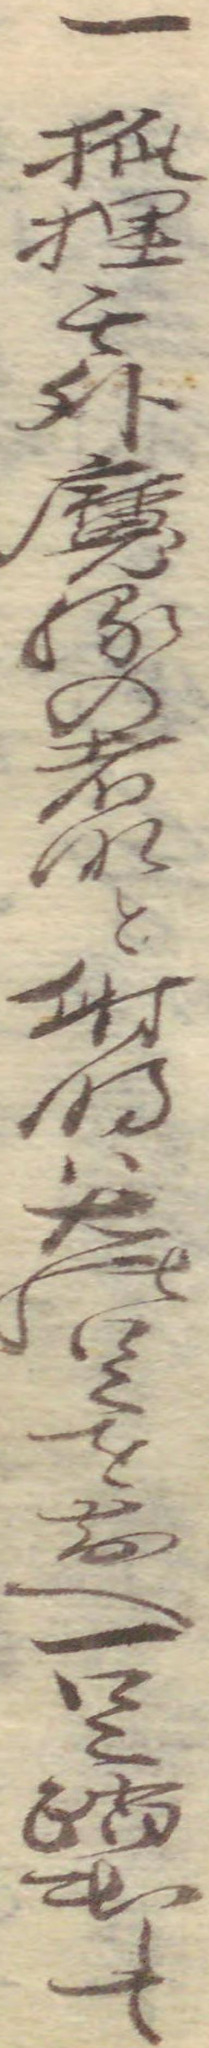一狐狸其外魔縁の者なと射時ハ右の足を前へ一足踏出して
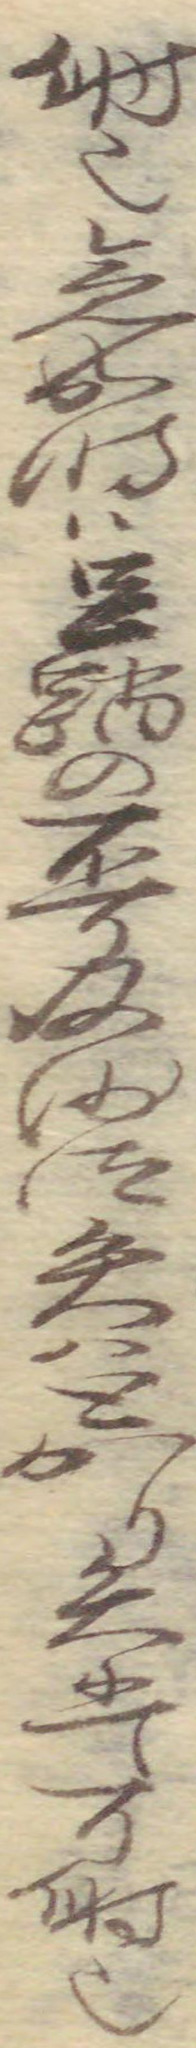射也急成時ハ足踏の不可及沙汰矢ハとかり矢にて可射也
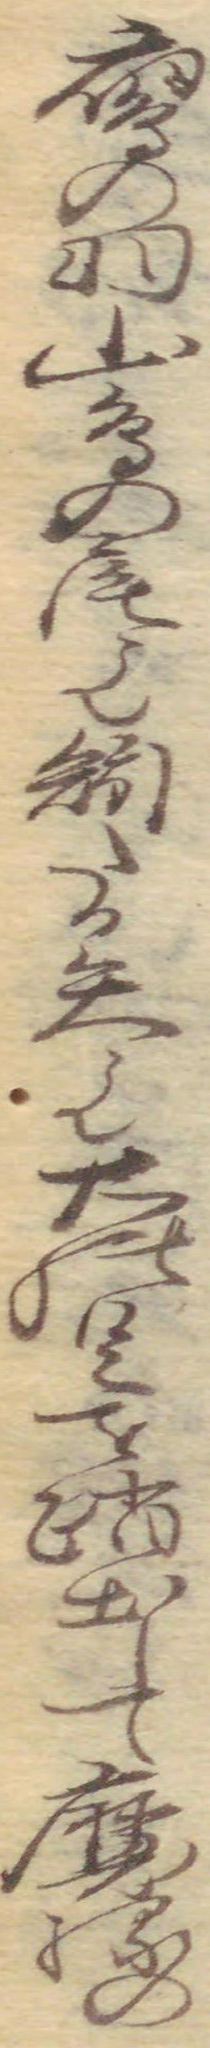鷹の羽山鳥の尾ニて矧たる矢にて右の足を踏出して魔縁の

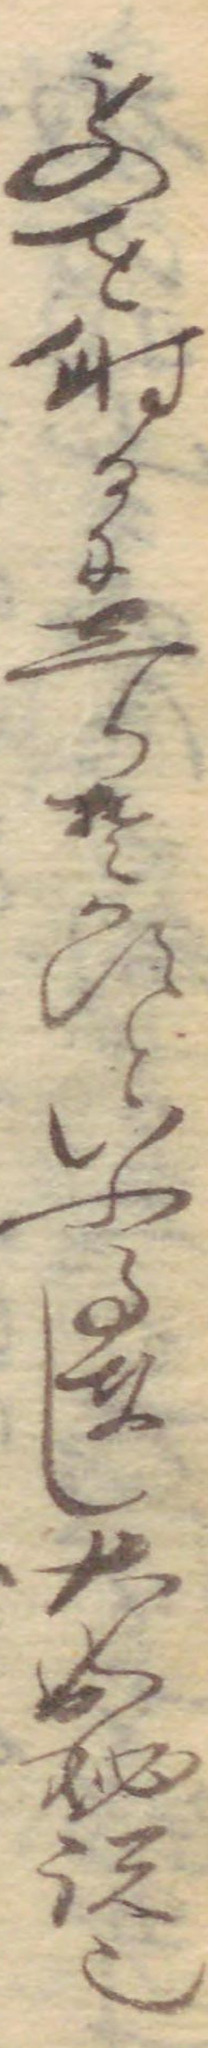ものを射るにしりそかすといふ事なし大成秘説也
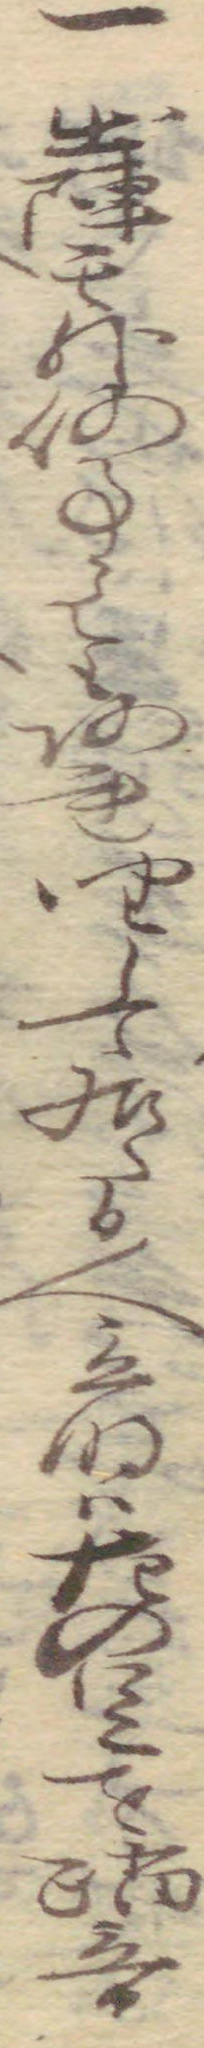一出陣其外何事ニてもあれ座して居たる人立時ハ左の足を踏立る
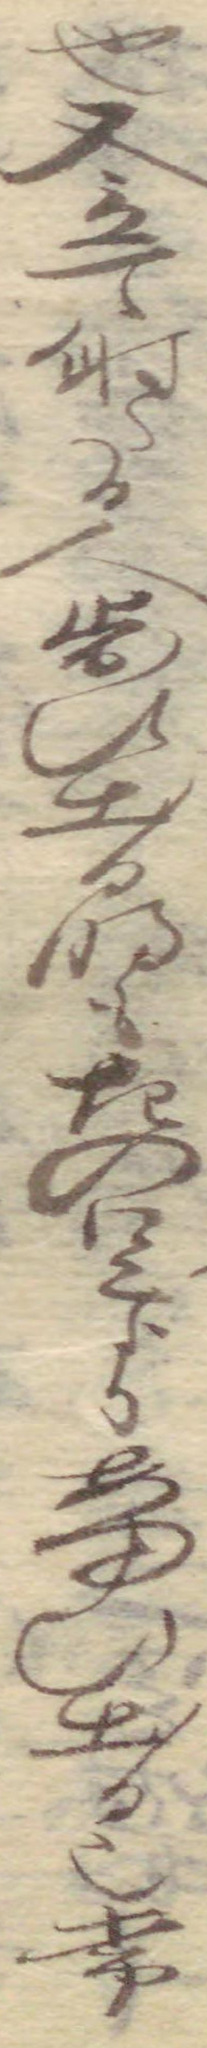也又立て射たる人歩ひ出る時も左の足よりあゆひ出る也常
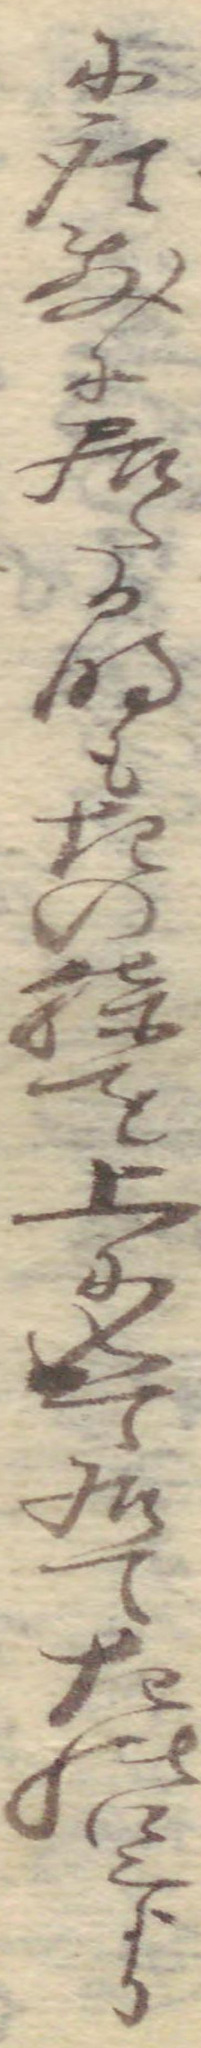に座敷に居たる時も左の膝を上に成て居て左の足より
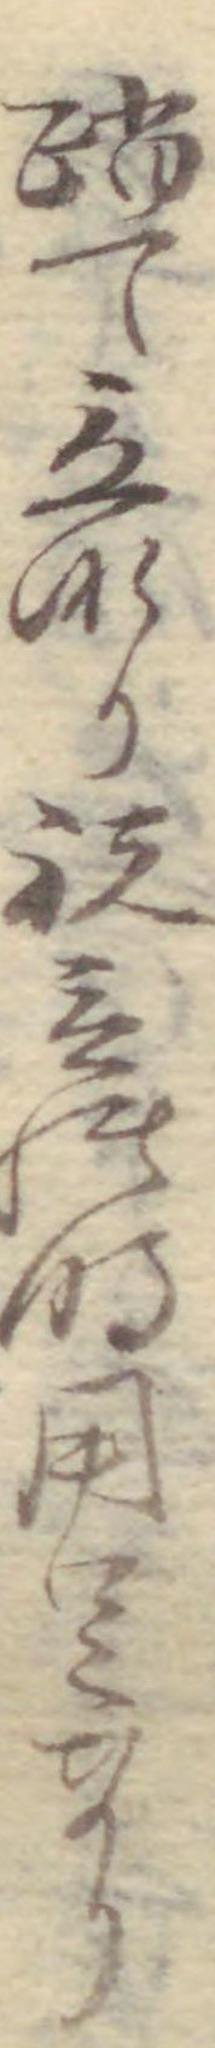踏て立なり祝言の時用足なり
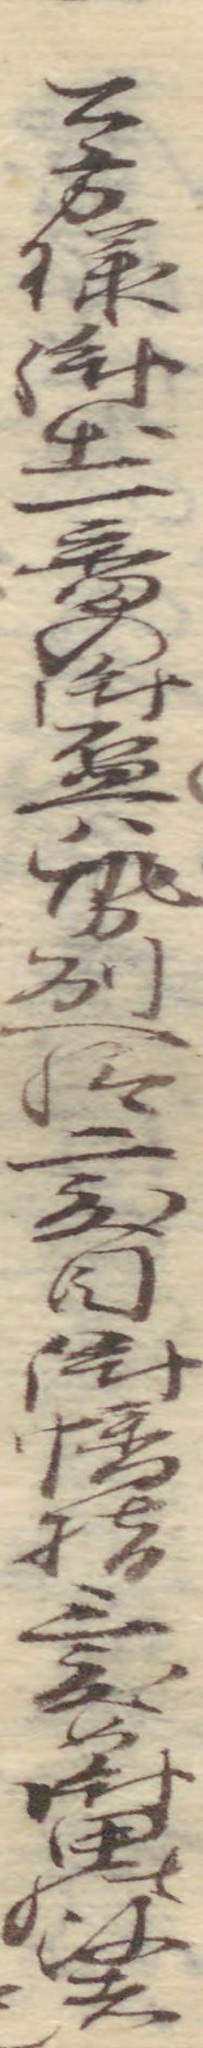一公方様御出一番の御盃ハ勢州へ給二度目御幡指三度め御甲の役者被給也
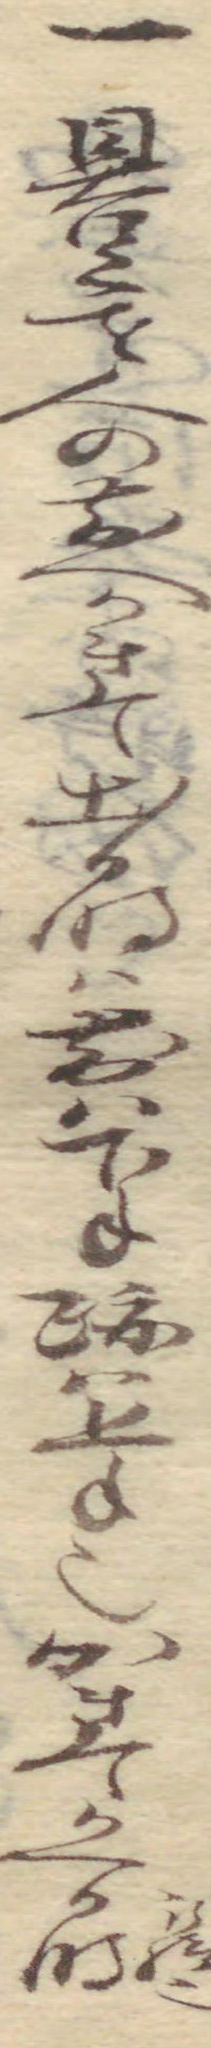一具足を人の前へかきて出る時ハ前ハ下手跡ハ上手也かきてかへる時
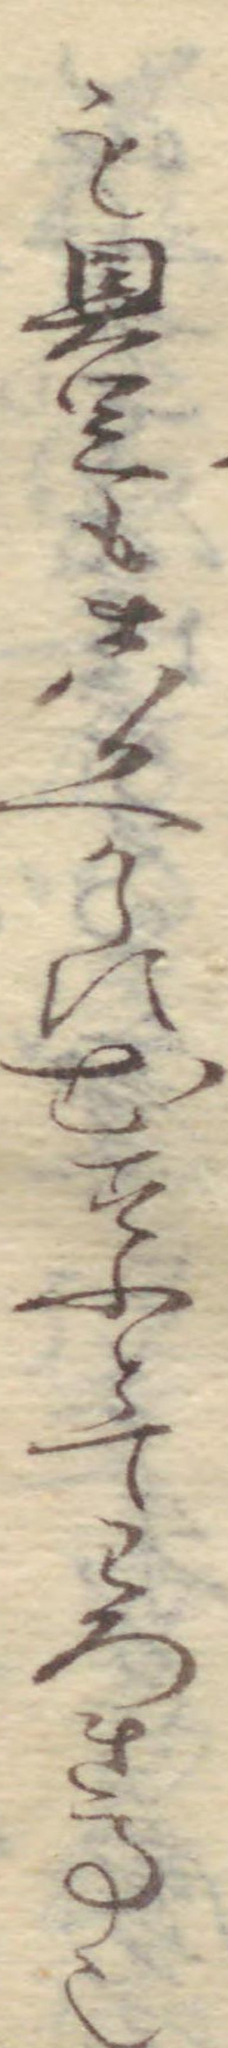も具足もまはるへからすむすふとてわろき事也
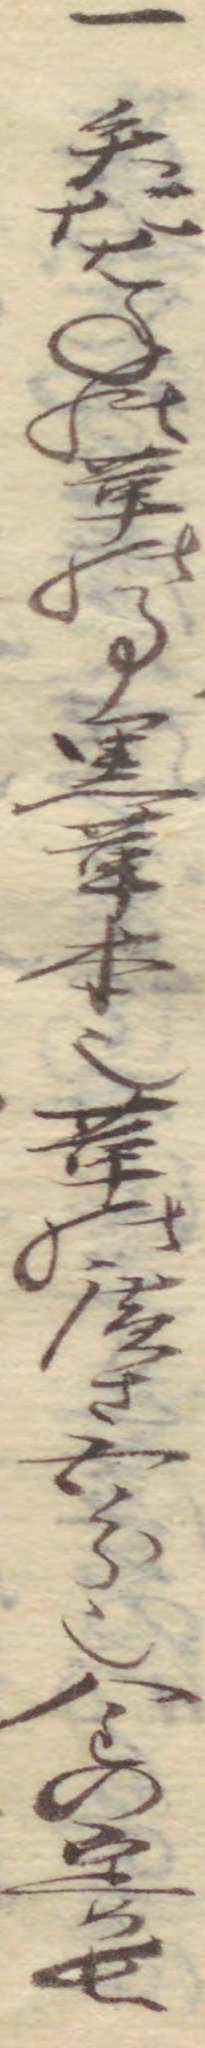一矢たはねの革の事黒革本也革の広さ五分也金の定め長
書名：鶯宿雑記. 巻199-200
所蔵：国立国会図書館 National Diet Library, JAPAN
